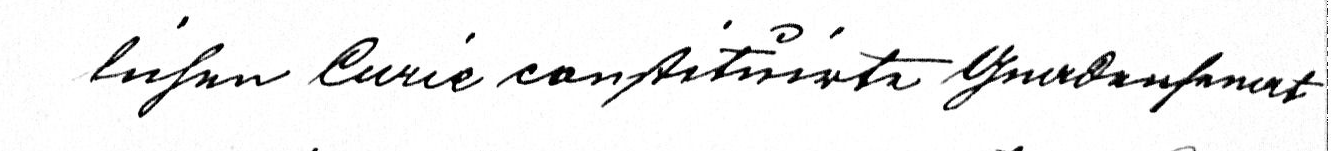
lichen Curie constituirte Gnadensenat
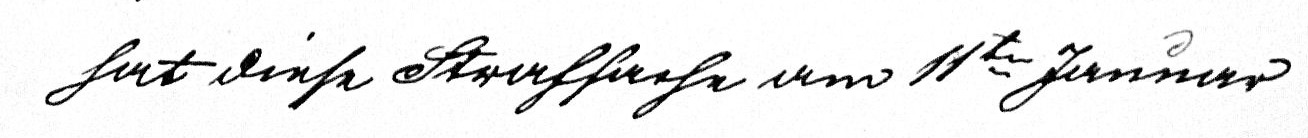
hat diese Straffache am 11ten Januar
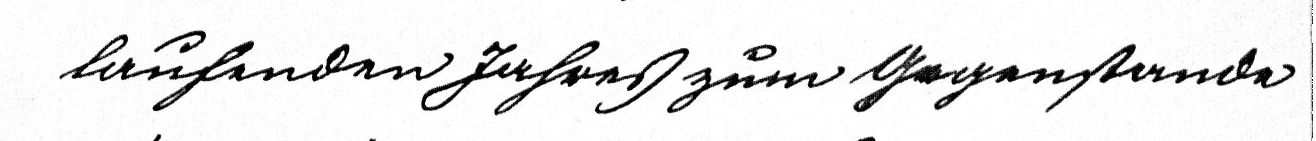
laufenden Jahres zum Gegenstande
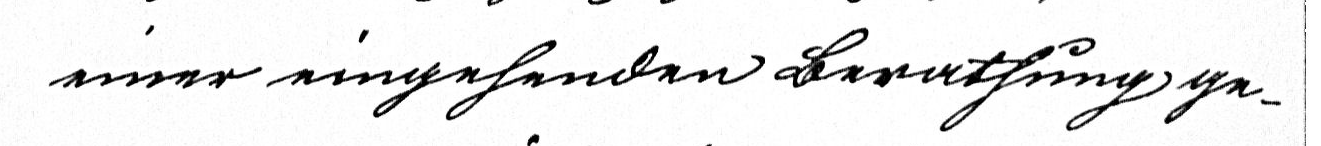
einer eingehenden Berathung ge¬
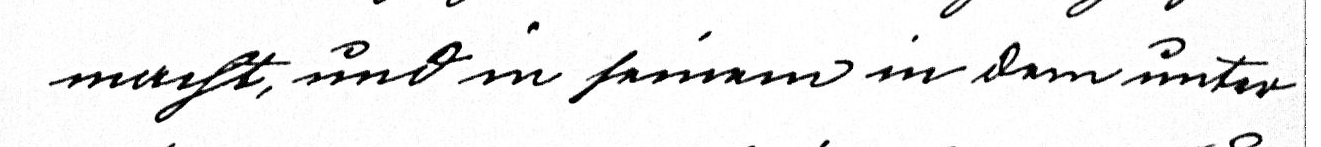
macht, und in seinem in dem unter
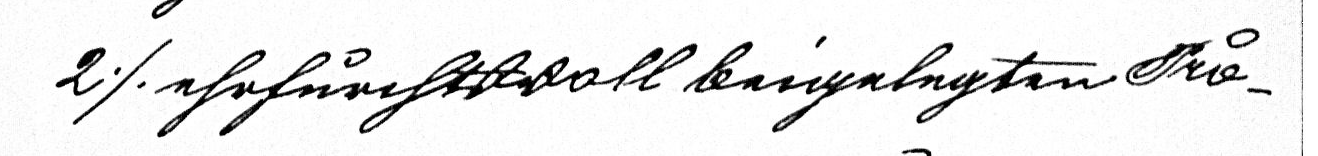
2 ./. ehrfurchtswoll beigelegten Pro¬
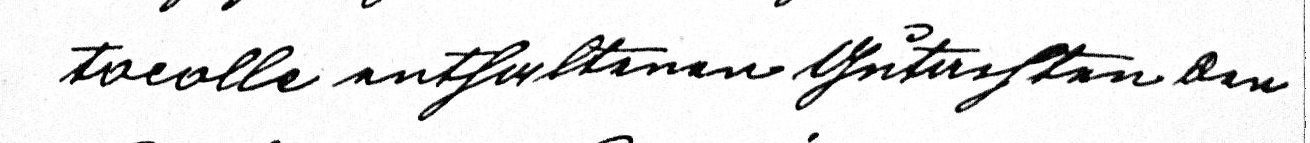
tocolle enthaltenen Gutachten den
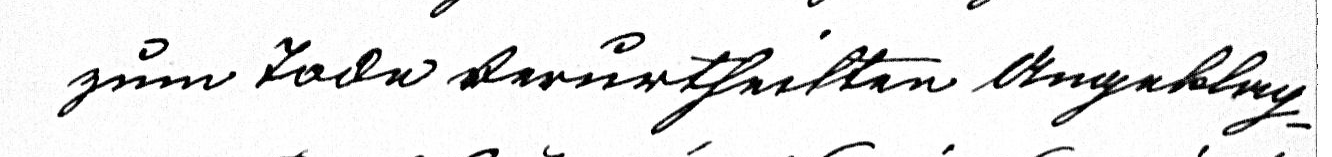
zum Tode verurtheilten Angeklag¬
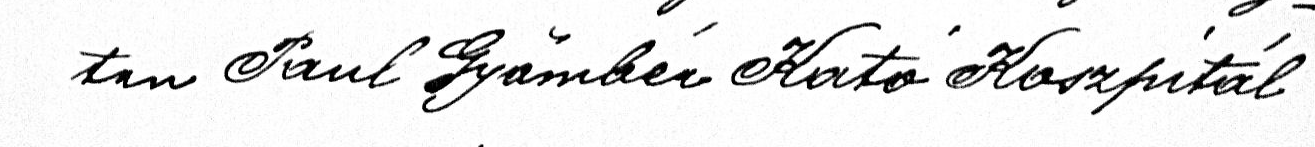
ten Paul Gyömbér Kató Koszpitál
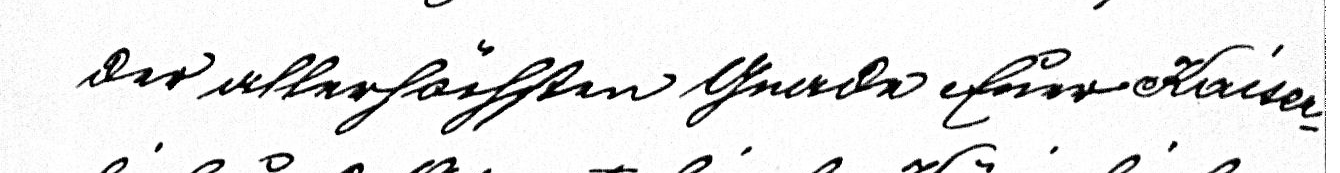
der allerhöchsten Gnade Euer Kaiser¬
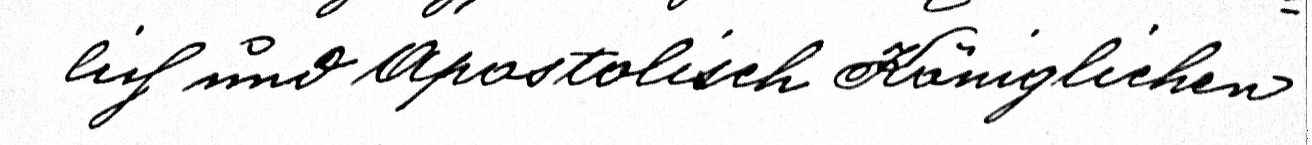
lich und Apostolisch Königlichen
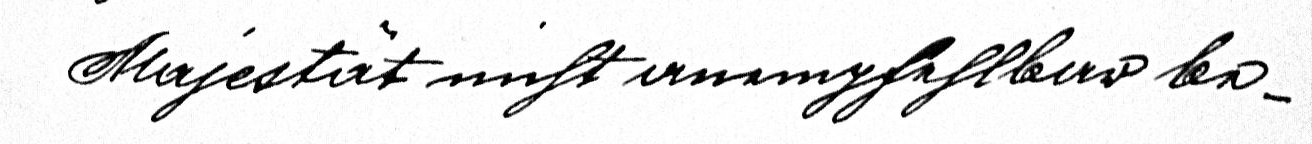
Majestät nicht anempfehlbar be¬
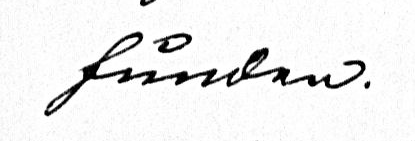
funden.
